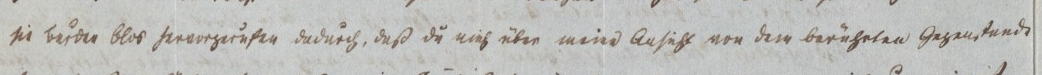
sie wurden blos hervorgerufen dadurch, daß du mich über meine Ansicht von dem berührten Gegenstande
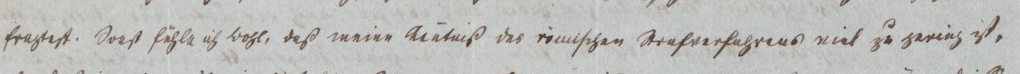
fragtest. Sonst fühle ich wohl, daß meine Kenntniß des römischen Strafverfahrens viel zu gering ist,
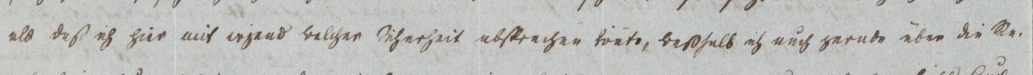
als daß ich hier mit irgend welcher Sicherheit absprechen könnte, weßhalb ich auch gerade über die Re-
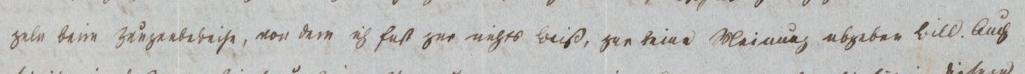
geln beim Zeugenbeweise, von dem ich fast gar nichts weiß, gar keine Meinung abgeben will. Auch
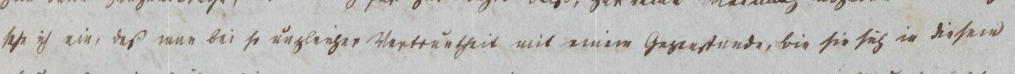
sehe ich ein, daß man bei so ungleicher Vertrautheit mit einem Gegenstande, wie sie sich in diesem
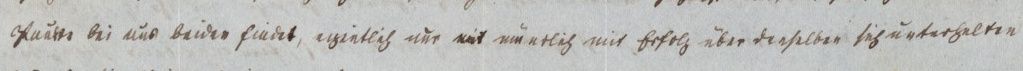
Punkte bei uns beiden findet, eigentlich nur mündlich mit Erfolg über denselben sich unterhalten
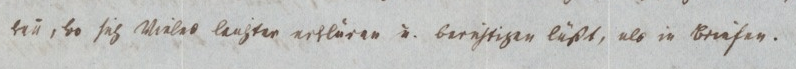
kann, wo sich Vieles leichter erklären u. berichtigen läßt, als in Briefen.
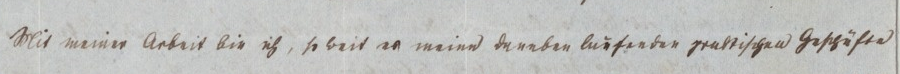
Mit meiner Arbeit bin ich, soweit es meine daneben laufenden praktischen Geschäfte
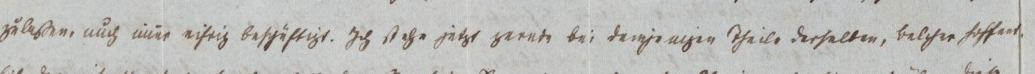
zulassen, auch immer eifrig beschäftigt. Ich stehe jetzt gerade bei demjenigen Theile derselben, welcher hoffent-
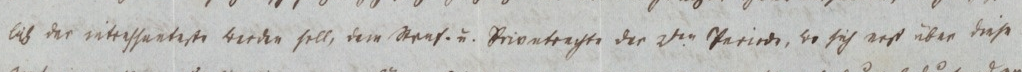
lich der intressanteste werden soll, dem Straf- und Privatrechte der 2ten Periode, wo sich erst über diese
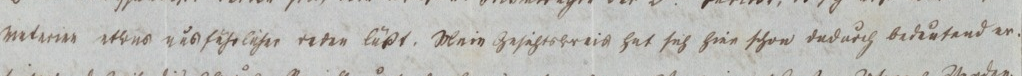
Materie etwas ausführlicher reden läßt. Mein Gesichtskreis hat sich hier schon dadurch bedeutend er-
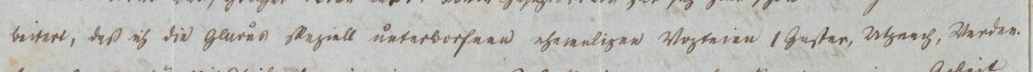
weitert, daß ich die Glarus speziell unterworfnen ehemaligen Vogteien (Gaster, Utznach, Werden-
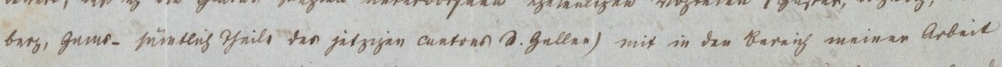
berg, Gams – sämtlich Theile des jetzigen Cantons St. Gallen) mit in den Bereich meiner Arbeit
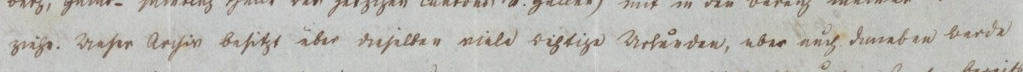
ziehe. Unser Archiv besitzt über dieselben viele wichtige Urkunden, aber auch daneben werde
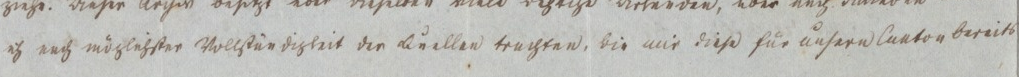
ich nach möglichster Vollständigkeit der Quellen trachten, wie mir diese für unsern Canton bereits
